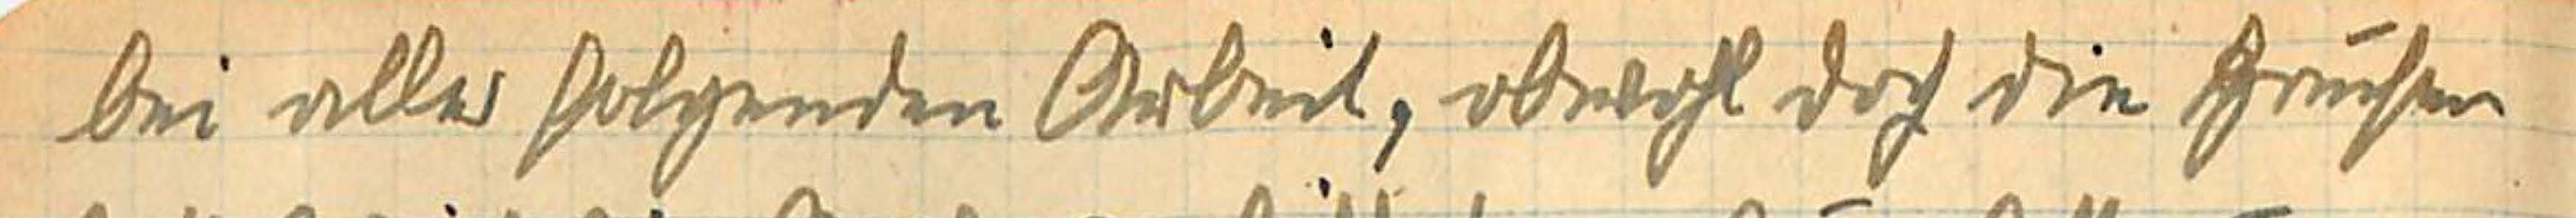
bei aller folgenden Arbeit, obwohl doch die Haufen
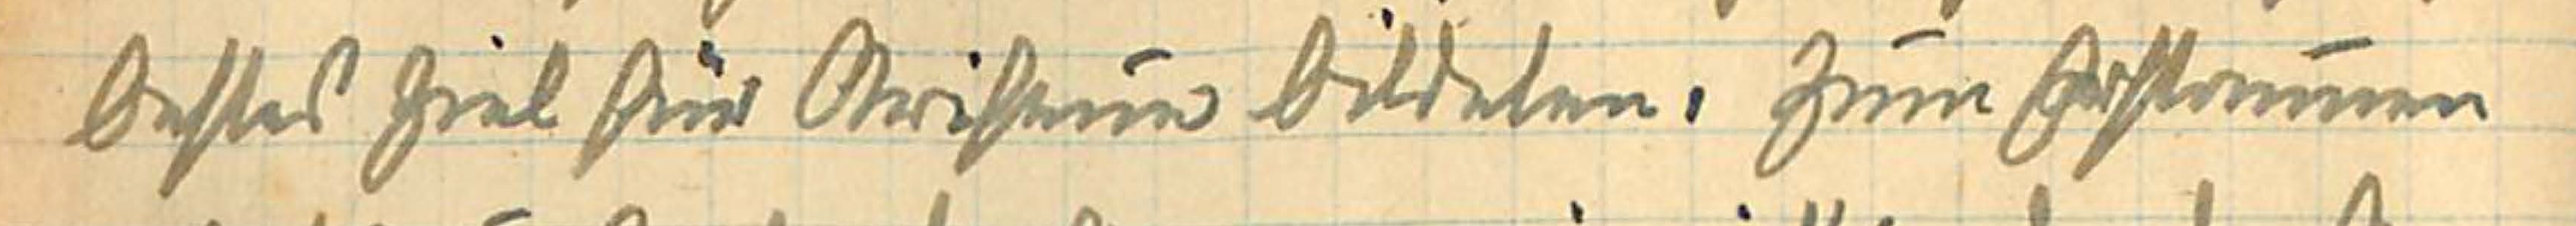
bestes Ziel für Arifeuer bildeten. Zum Erstaunen
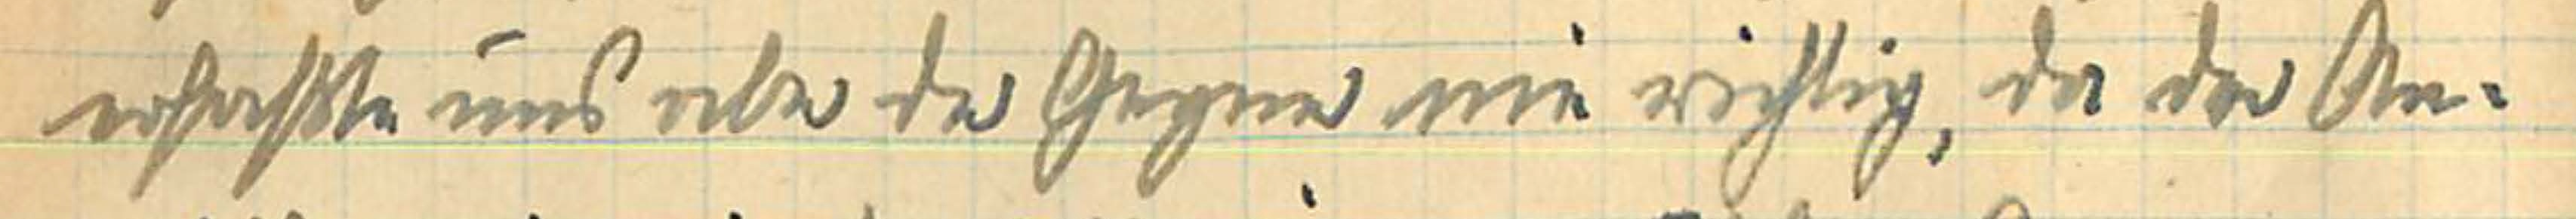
erfaßte uns aber der Gegner nie richtig, da der An-
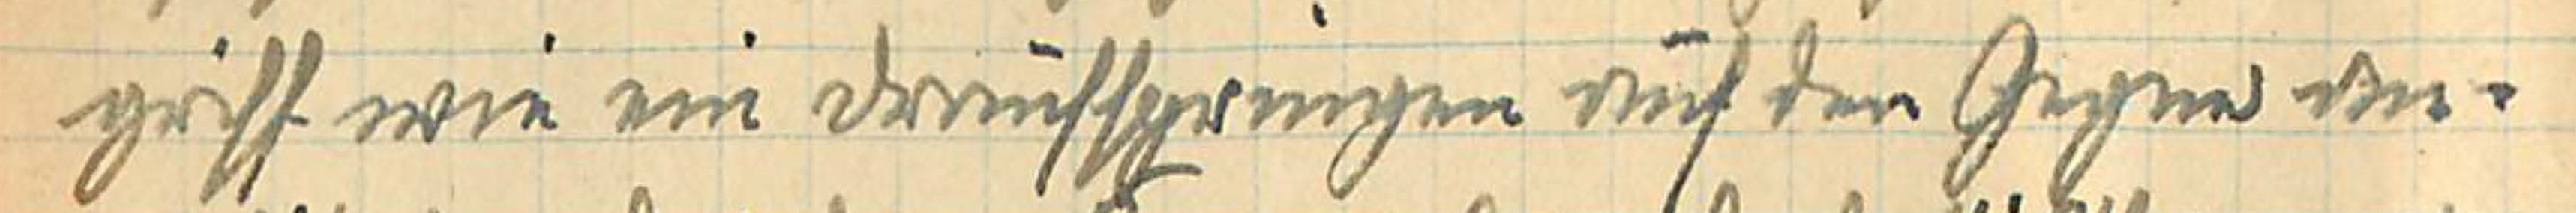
griff wie ein Draufspringen auf den Gegner an-
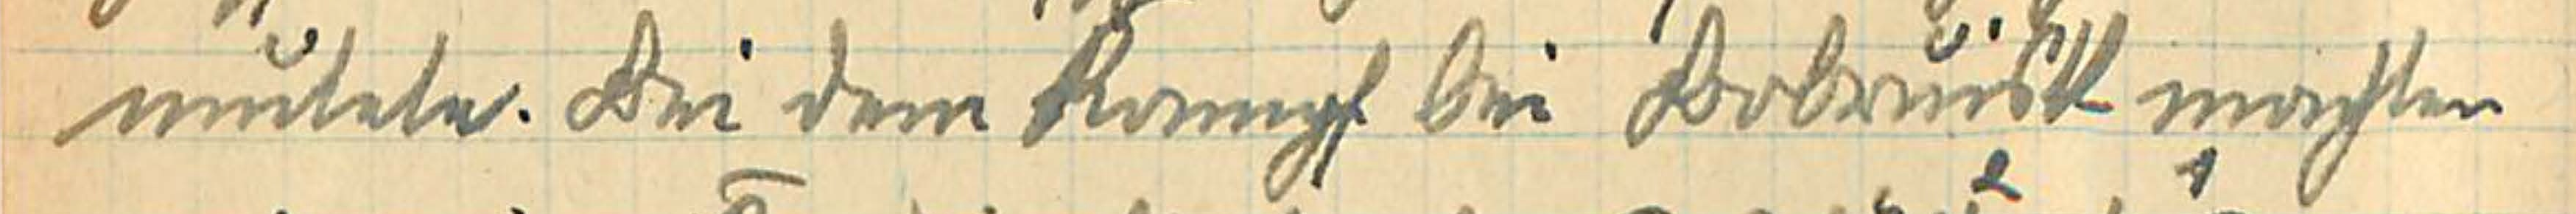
mutete. Bei dem Kampf bei Bobruisk machten
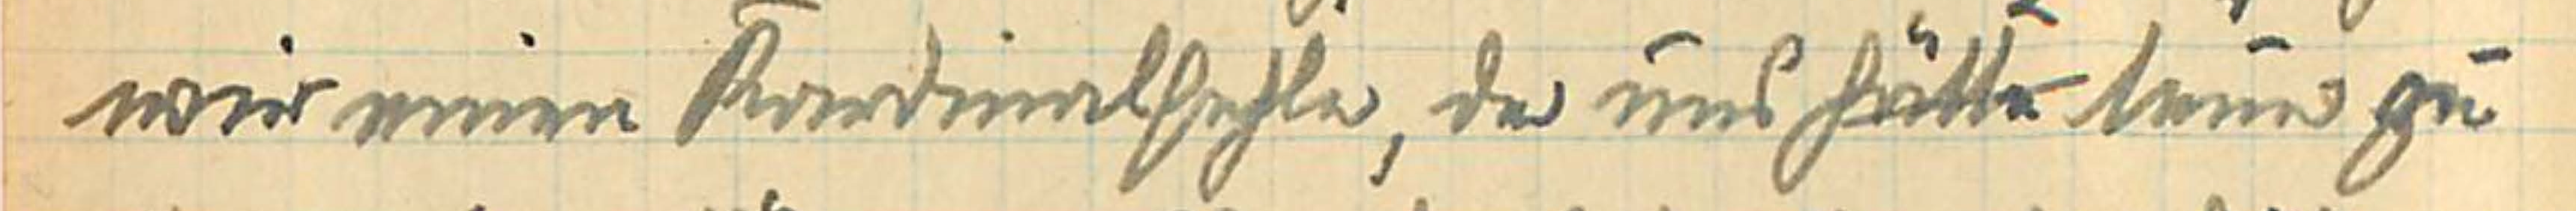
wir einen Kardinalfehler, der uns hätte teuer zu
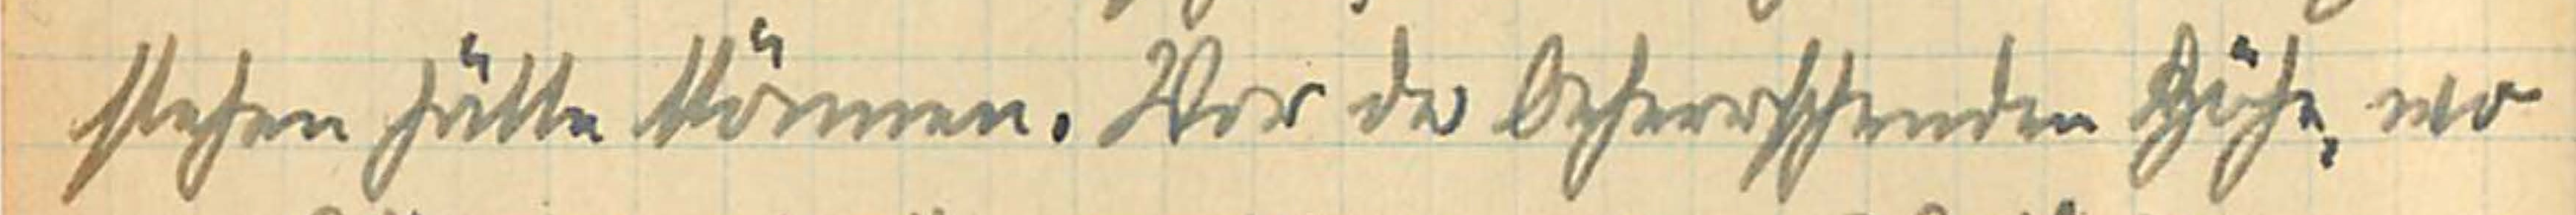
stehen hätte können. Vor der beherrschenden Höhe, wo
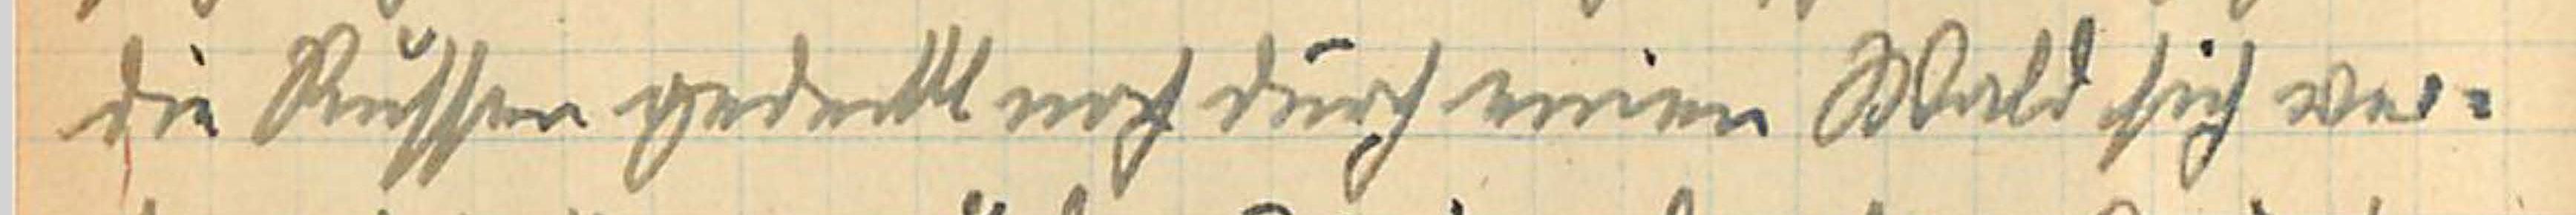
die Russen gedeckt noch durch einen Wald sich ver-
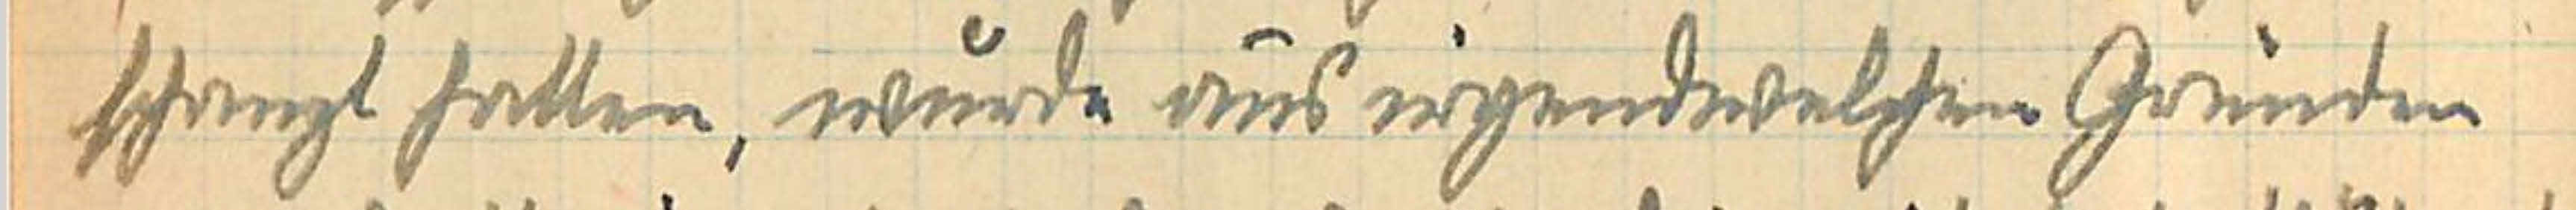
schanzt hatten, wurde aus irgendwelchen Gründen
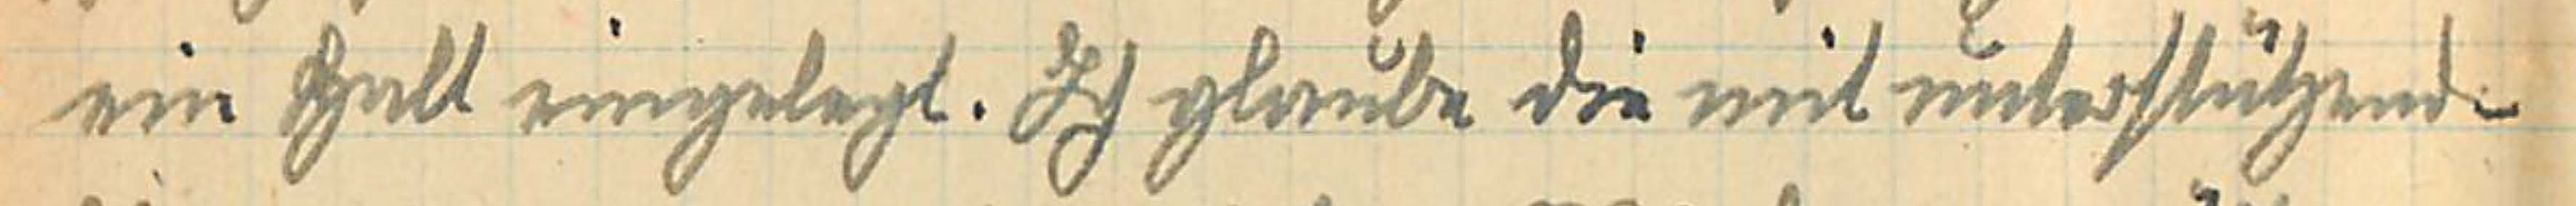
ein Halt eingelegt. Ich glaube die mit unterstützenden
